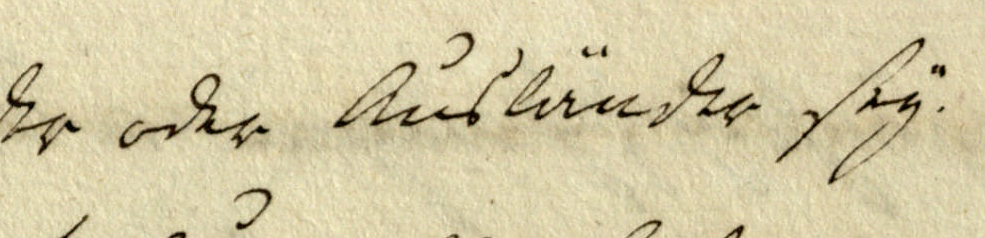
länder oder Ausländer seÿ.
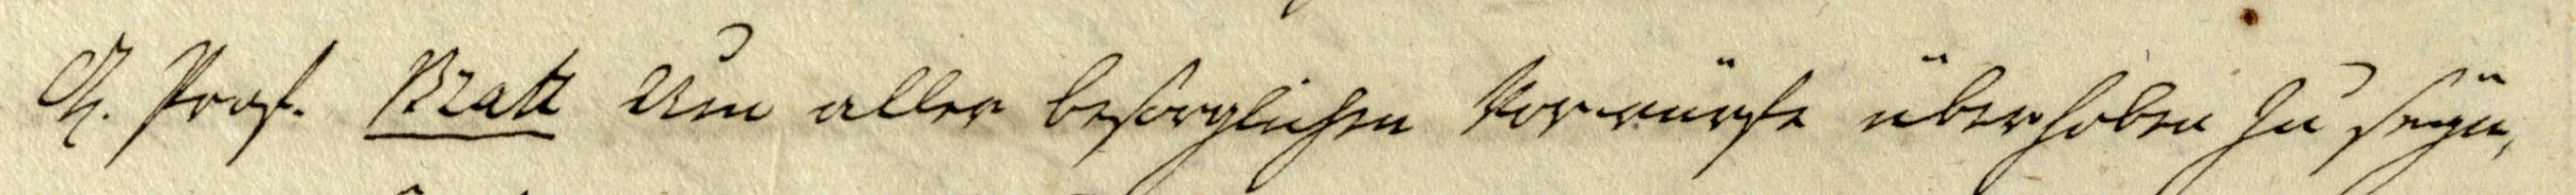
dh. Prof. Bratt Um aller besorglichen Vorwürfe überhoben zu seÿn,
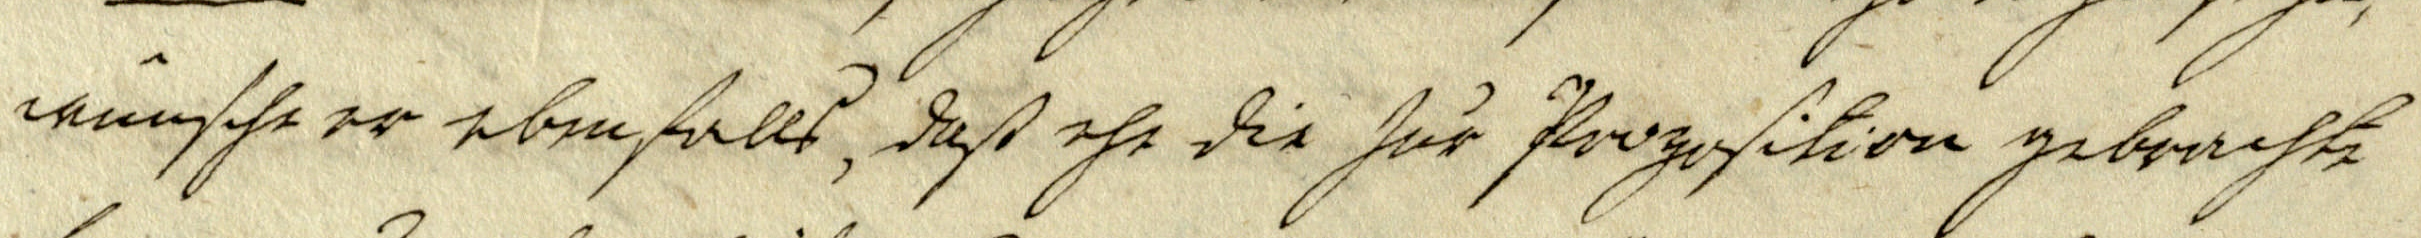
wünsche er ebenfalls, daß ehe die zur Proposition gebrachte
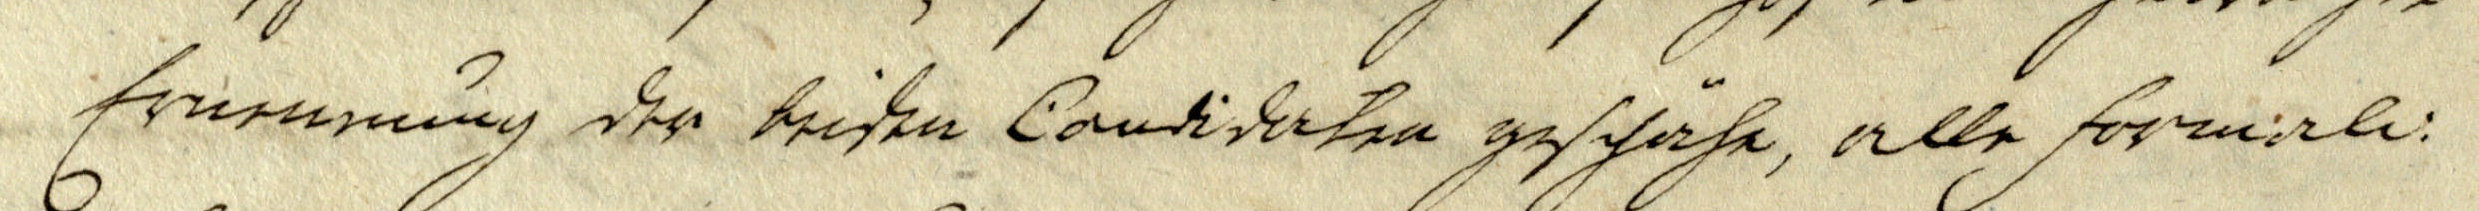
Ernennung der beiden Candiaten geschähe, alle Formali¬
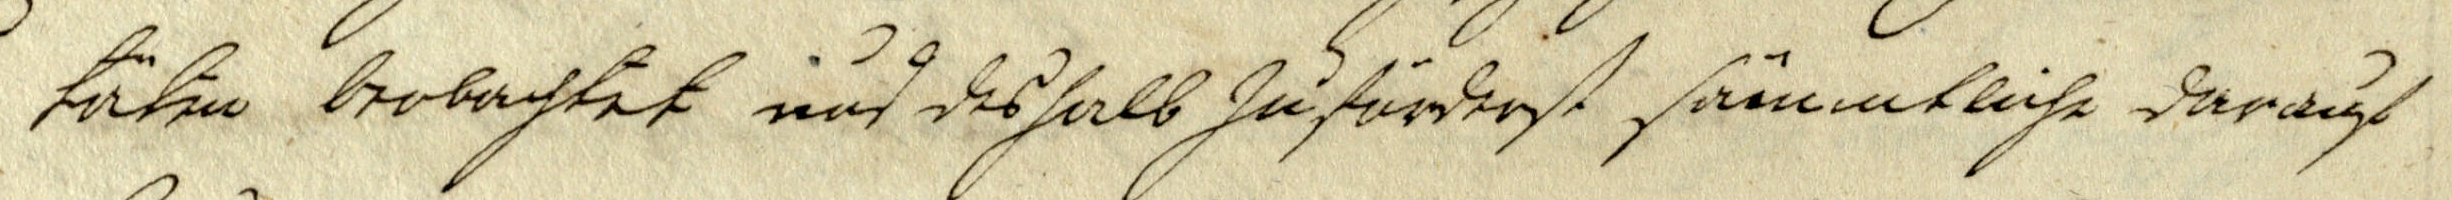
täten beobachtet und deshalb zuförderst sämmtliche darauf
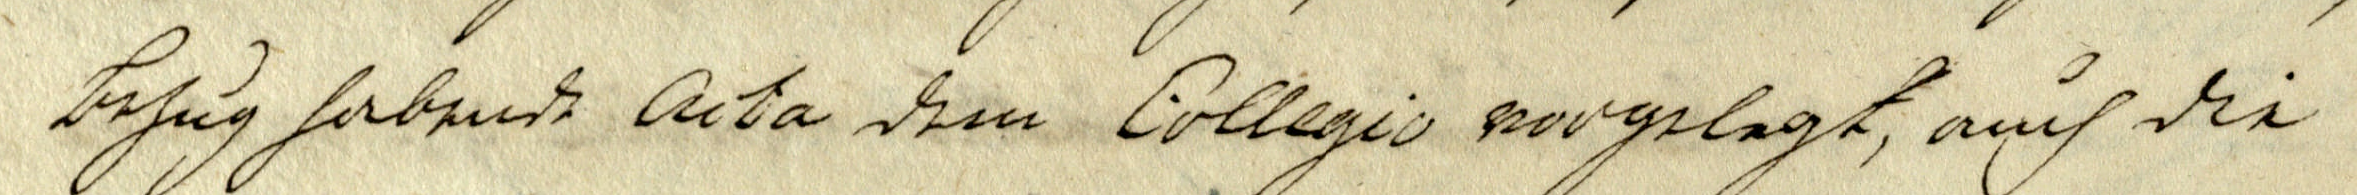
Bezug habende Acta dem Collegio vorgelegt, auch die
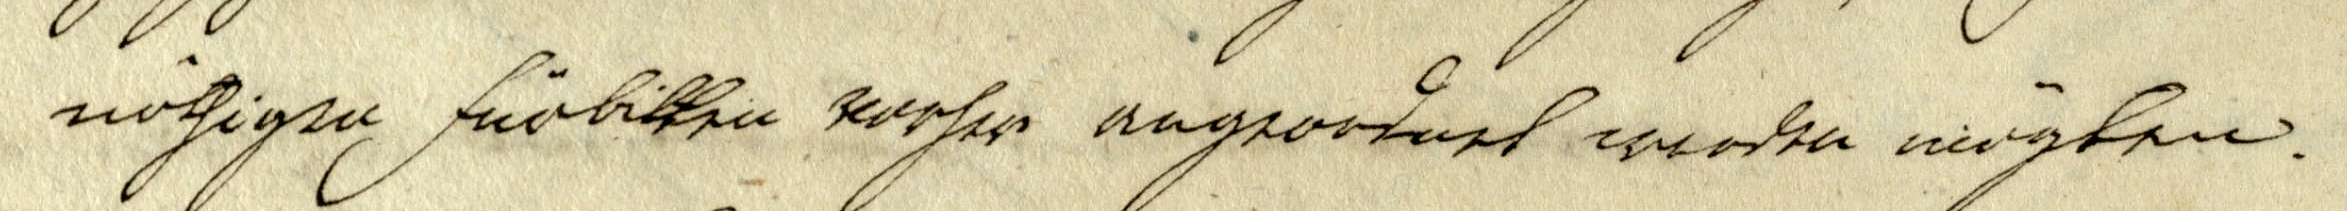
nöthigen Fürbitten vorher angeordnet werden mögten.
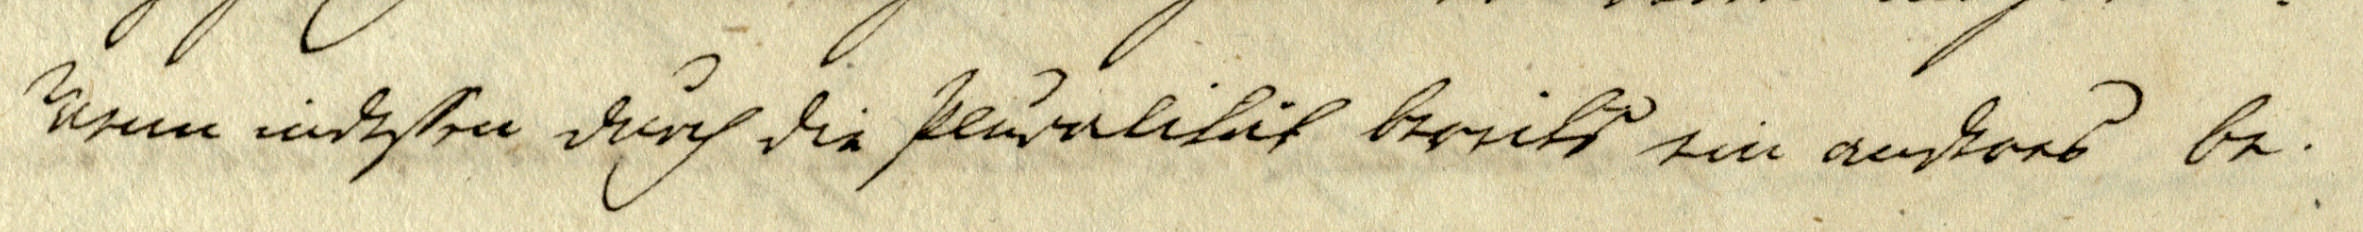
Wenn indessen durch die Pluralität bereits ein anderes be¬
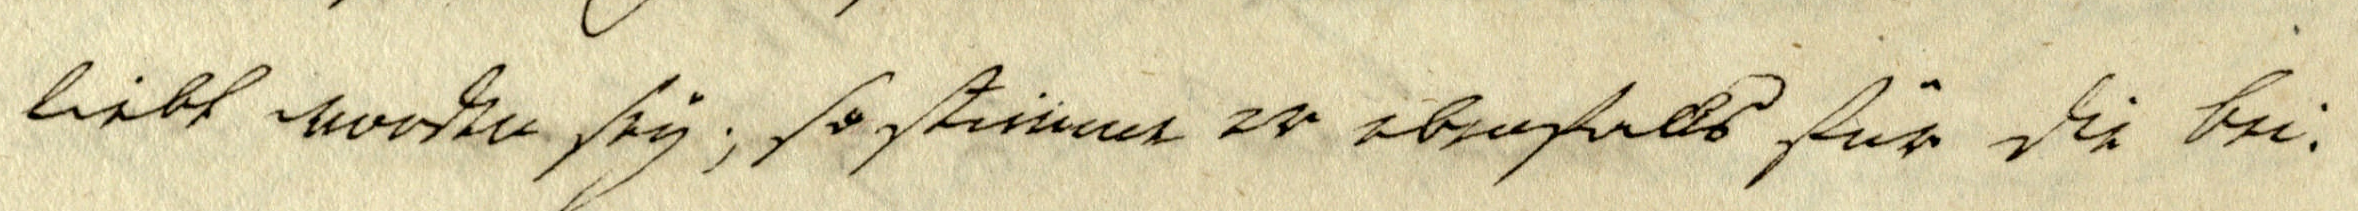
liebt worden seÿ, so stimme er ebenfalls für die bei¬
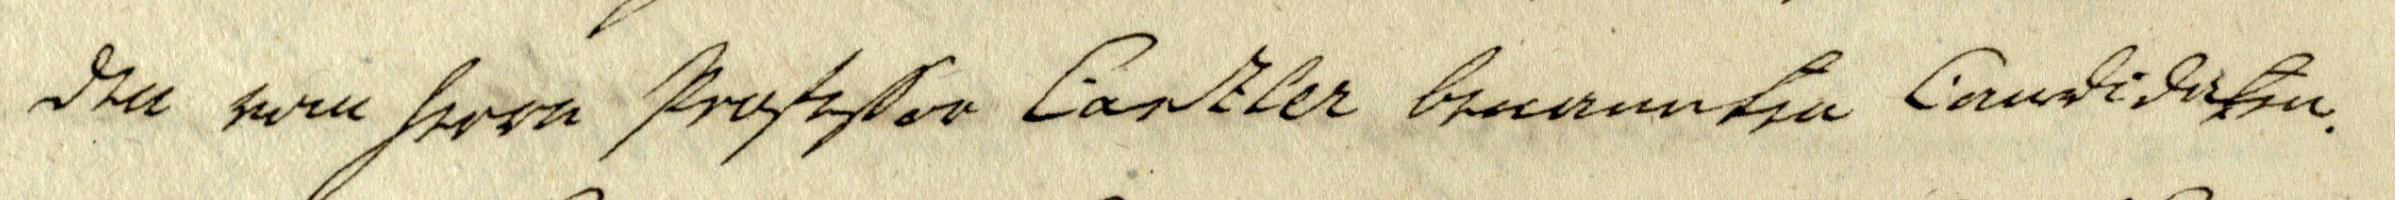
den vom herrn Professor Canzler benannten Candidaten.
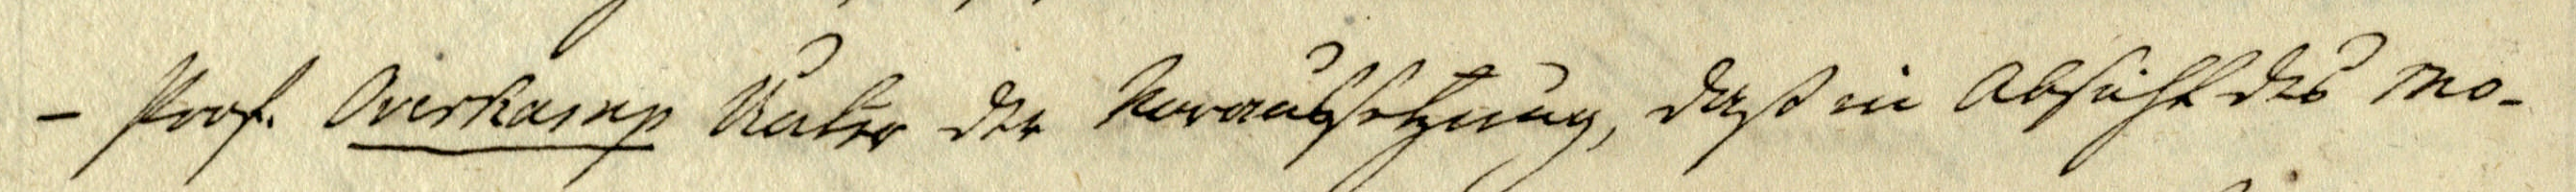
Prof. Overkamp Unter der Voraussetzung, daß in Absicht des mo¬
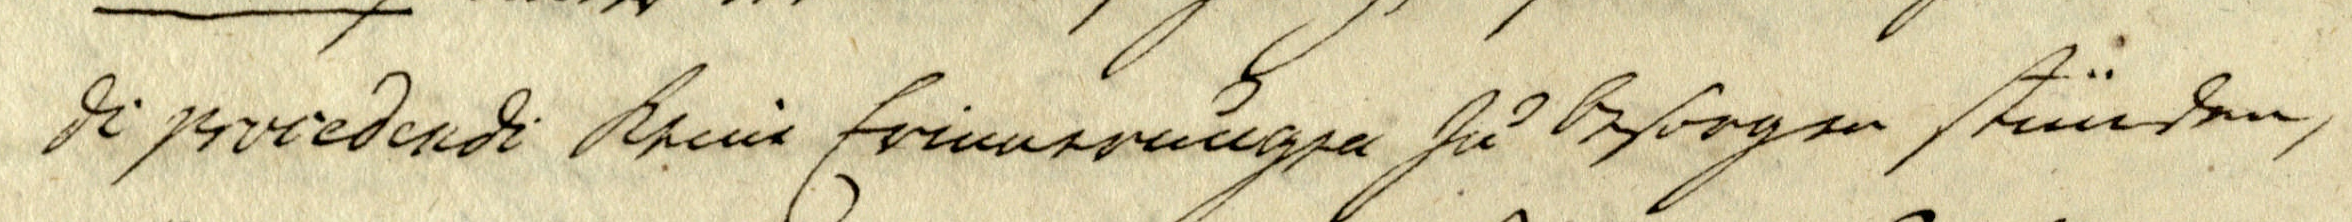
die procedendi keine Erinnerungen zu besorgen stünden,
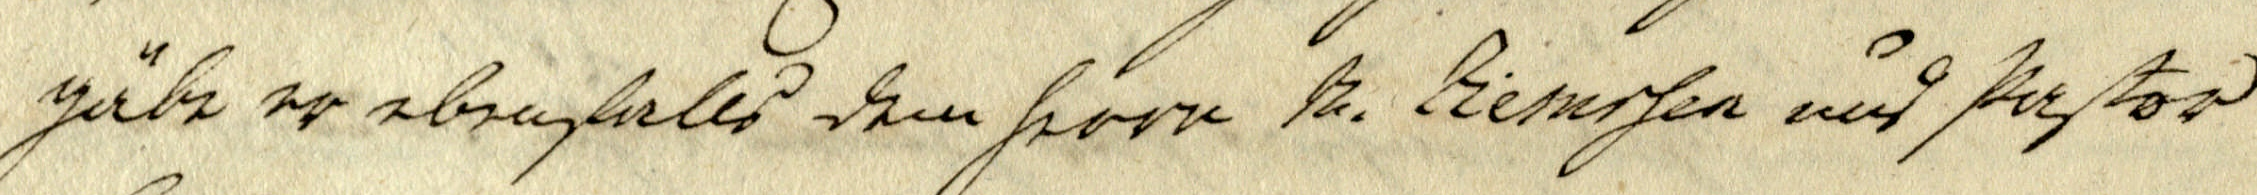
gäbe er ebenfalls dem herrn M. Ziemssen und Pastor
